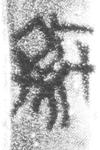索（素）
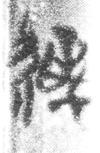緄
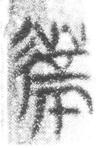○（帶）
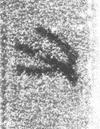又（有）
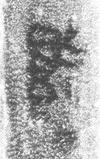鉤
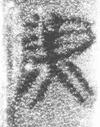黃
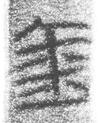金
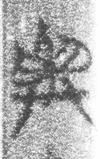與
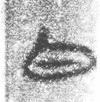白
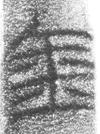金
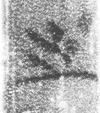之
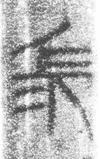舄
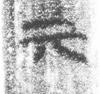亓（其）
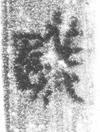○（佩）
